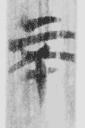不
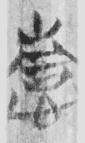情
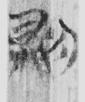則
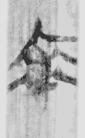手
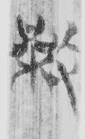{喿攴}
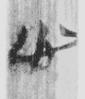心
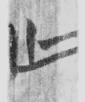亡
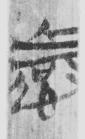𢝬
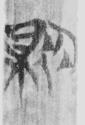則
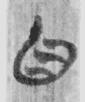目
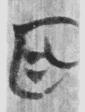耳
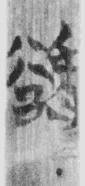豫
